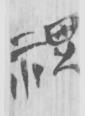{示田儿}
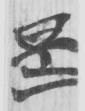是
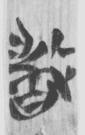敢
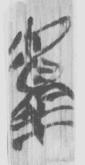鬳
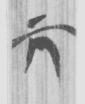元
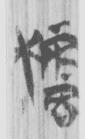{木丙丙口}
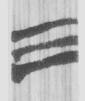三
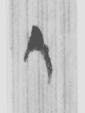人
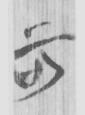可
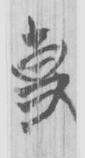吏
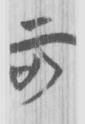可
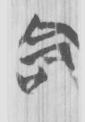命
